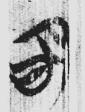明
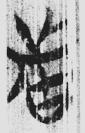者
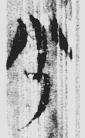少
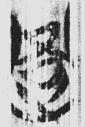○（疏）
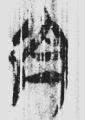於
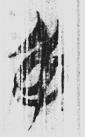身
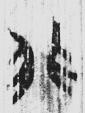非
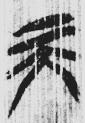天
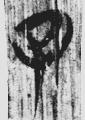子
